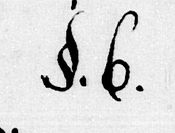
§. 6.
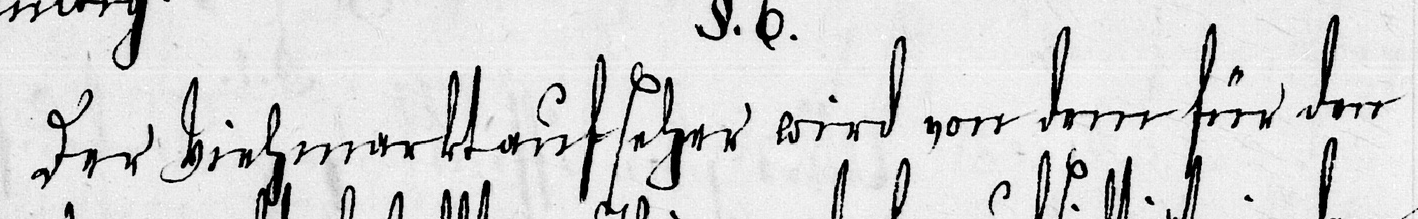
Der Viehmarktaufseher wird von dem für den
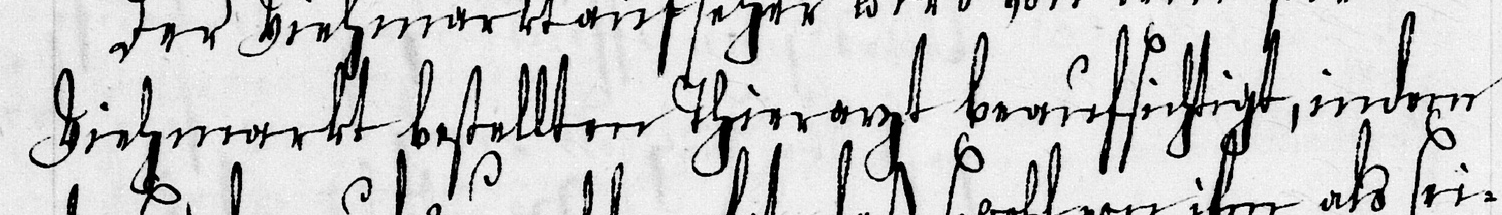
Viehmarkt bestellten Thierarzt beaufsichtigt, indem
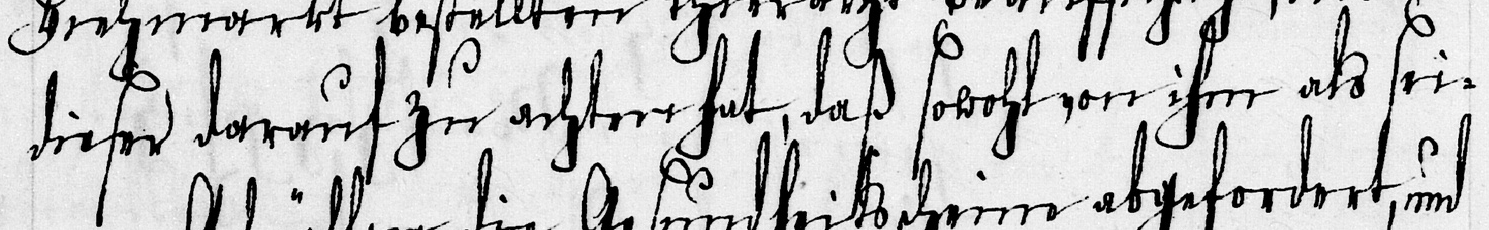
dieser darauf zu achten hat, daß sowohl von ihm als sei¬
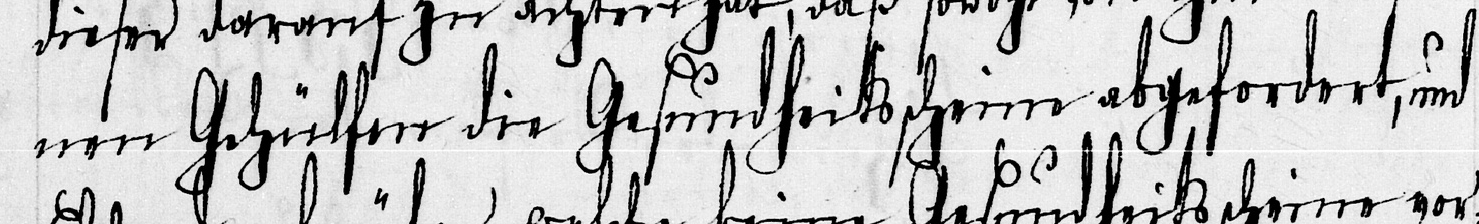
nen Gehülfen die Gesundheitsscheine abgefordert,
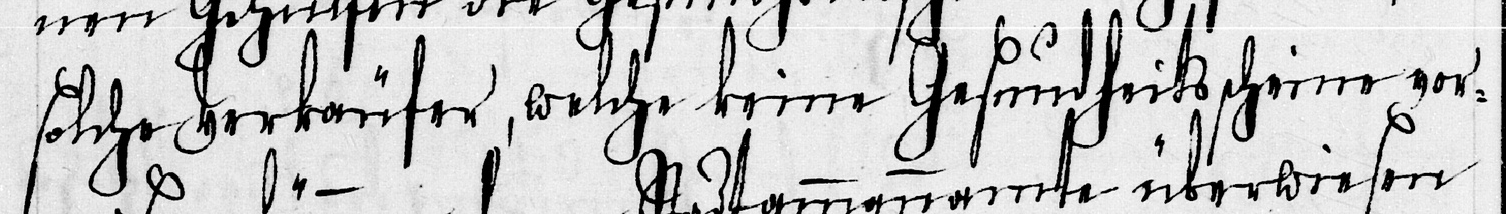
solche Verkäufer, welche keine Gesundheitsscheine vor¬
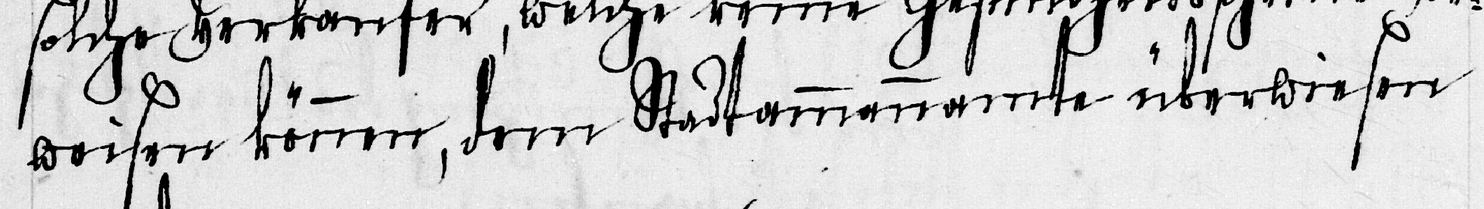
weisen können, dem Stadtammannamte überwiesen
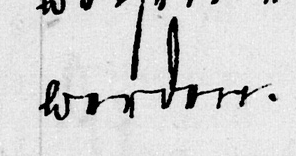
werden.
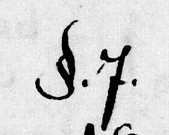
§. 7.
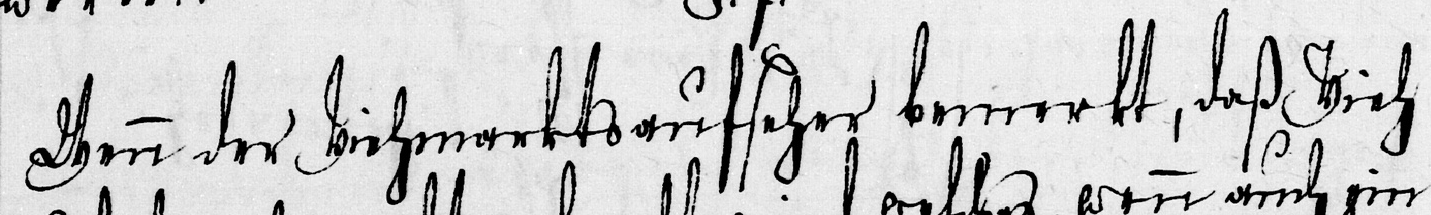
Wenn der Viehmarktaufseher bemerkt, daß Vieh
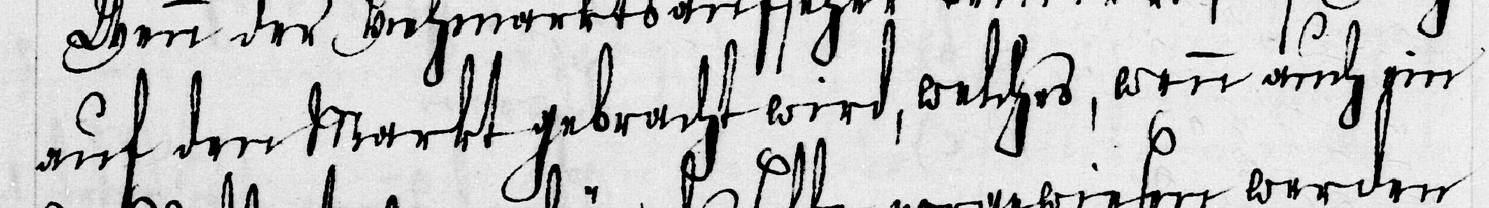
auf den Markt gebracht wird, welches, wenn auch ein
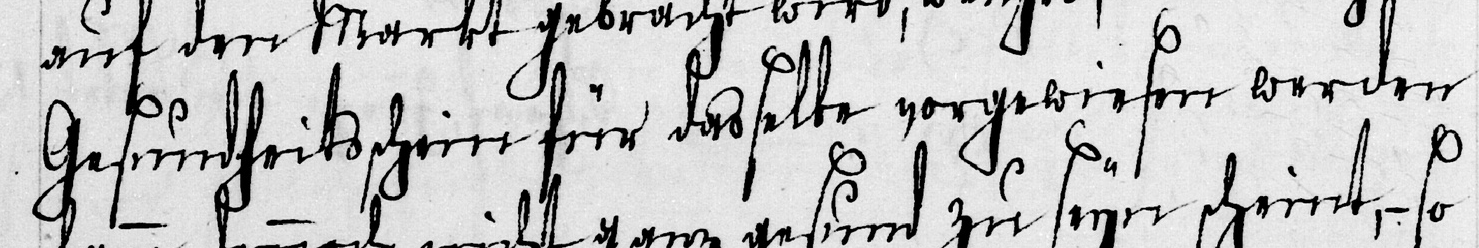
Gesundheitsschein für dasselbe vorgewiesen werden
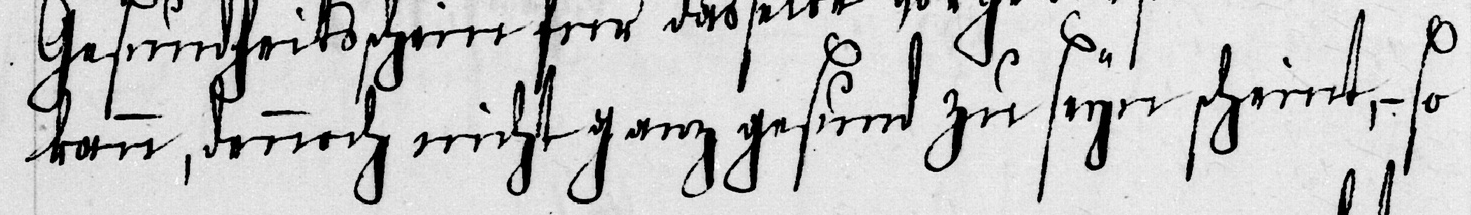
kann, dennoch nicht ganz gesund zu seyn scheint,– so
